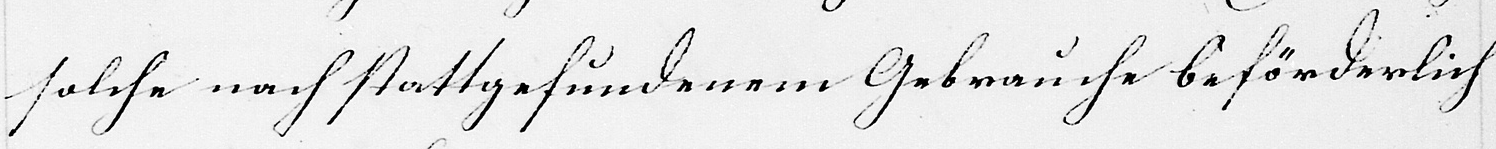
solche nach stattgefundenem Gebrauche beförderlich
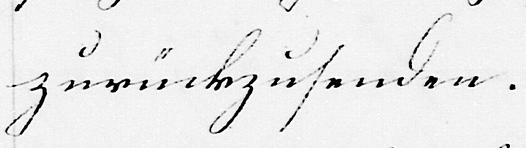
zurückzusenden.
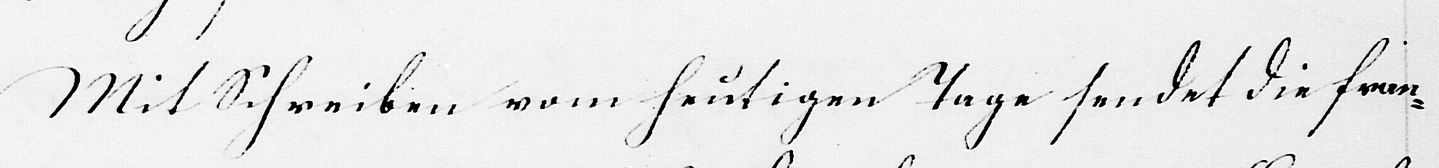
Mit Schreiben vom heutigen Tage sendet die fran¬
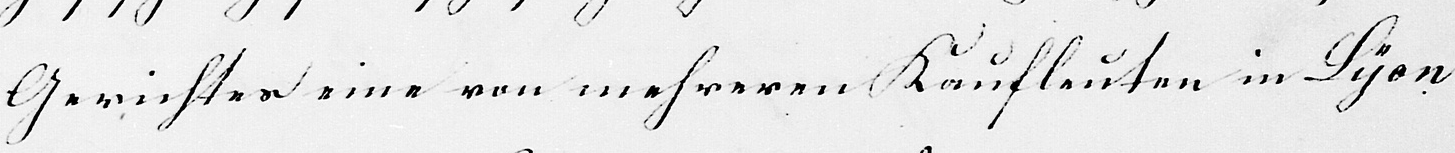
erichtes eine von mehreren Kaufleuten in Lyon
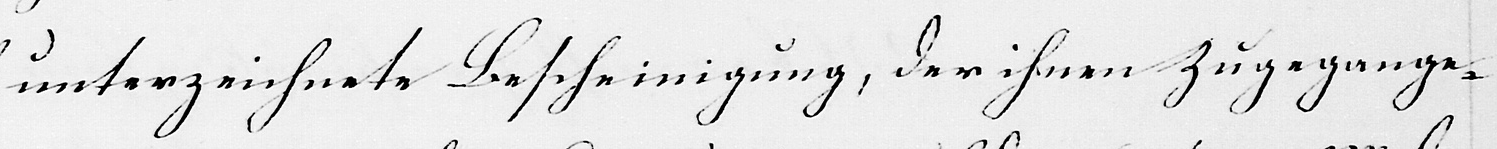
unterzeichnete Bescheinigung, der ihnen zugegange¬
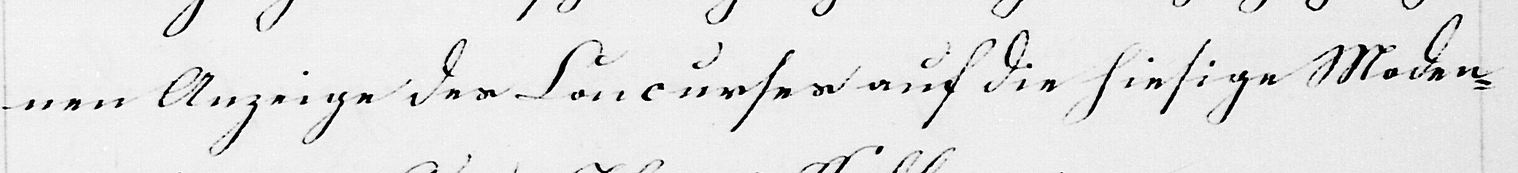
nen Anzeige des Concurses auf die hiesige Moden¬
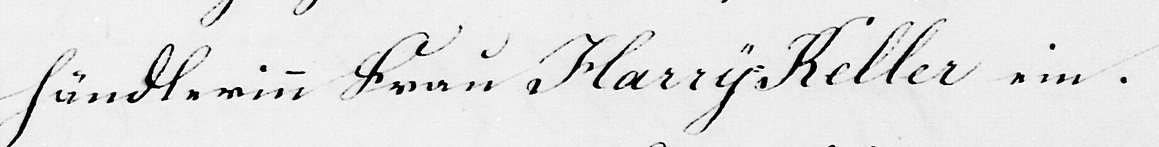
händlerinn Frau Harry Keller ein.
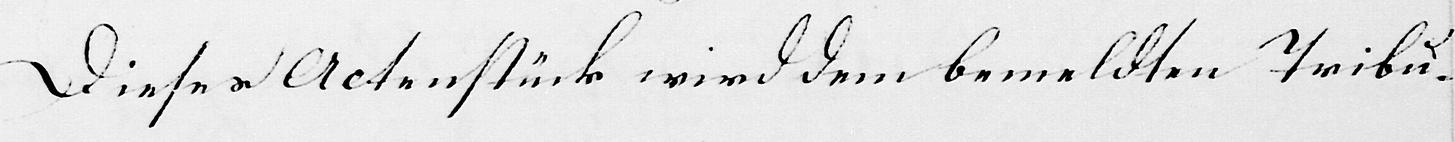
Dieses Actenstück wird dem bemeldten Tribu¬
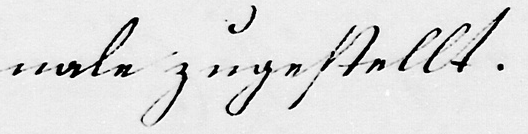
nale zugestellt.
